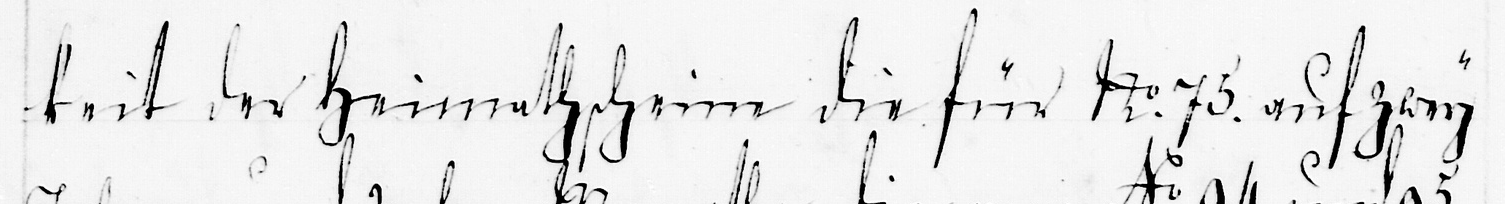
keit der Heimathscheine die für N°. 75. auf zwey
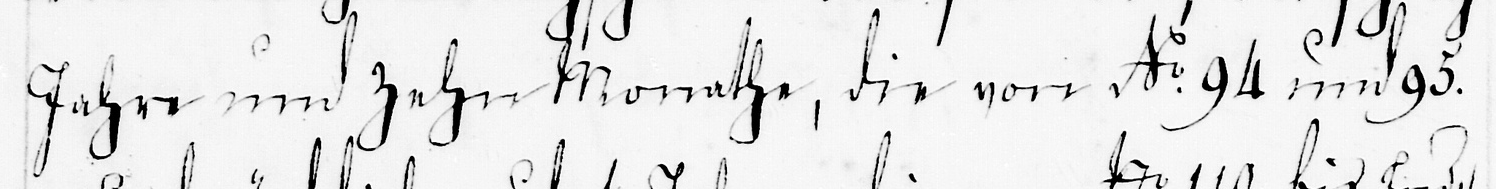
Jahre und zehn Monathe, die von N°. 94 und 95.
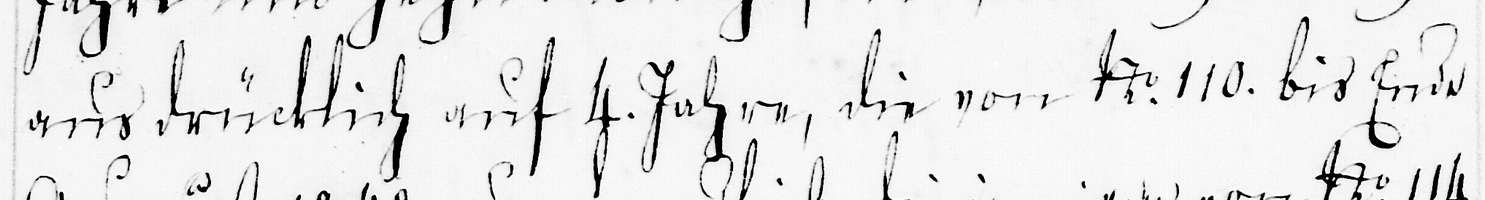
ausdrücklich auf 4. Jahre, die von N°. 110. bis Ende
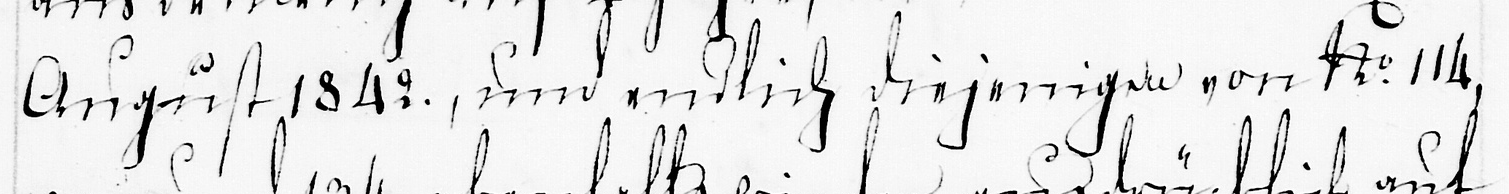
August 1842., und endlich diejenigen von N°. 114,
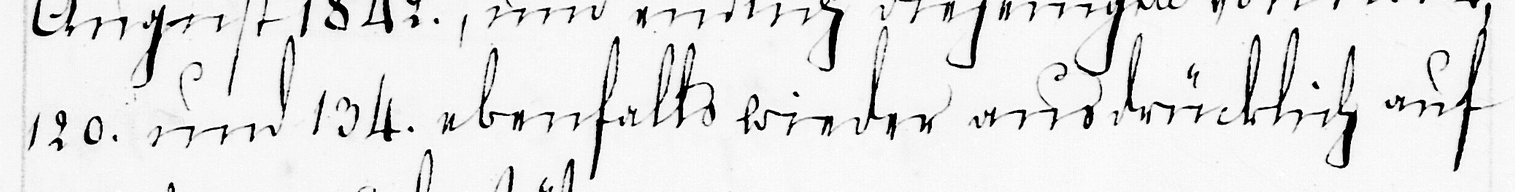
120. und 134. ebenfalls wieder ausdrücklich auf
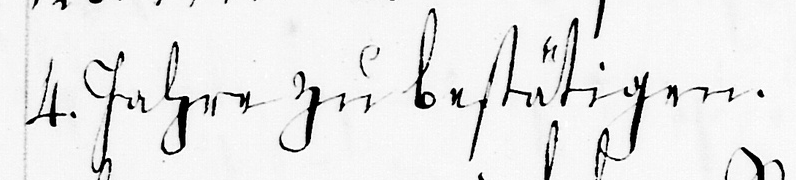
4. Jahre zu bestätigen.
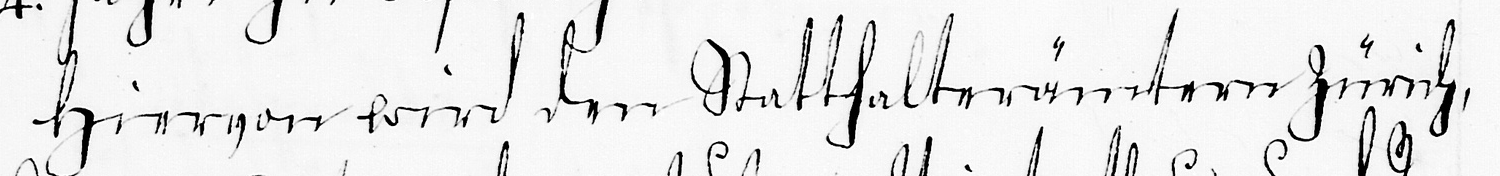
Hiervon wird den Statthalterämtern Zürich,
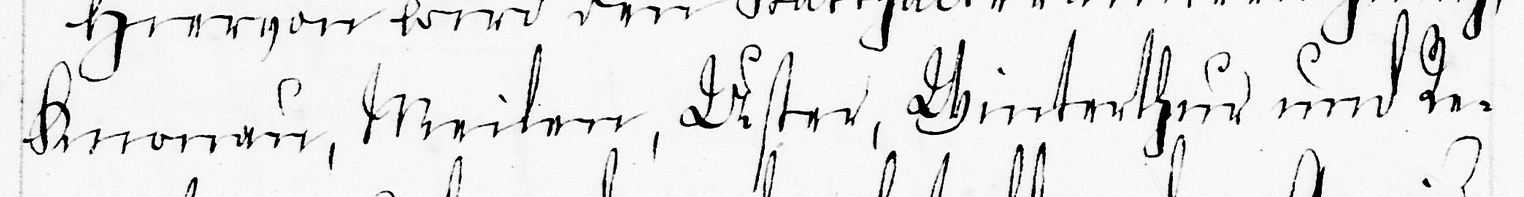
Knonau, Meilen, Uster, Winterthur und Re¬
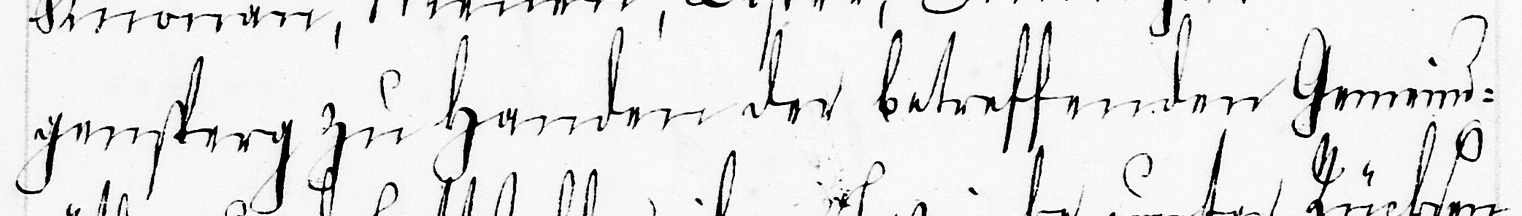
gensperg zu Handen der betreffenden Gemeind¬
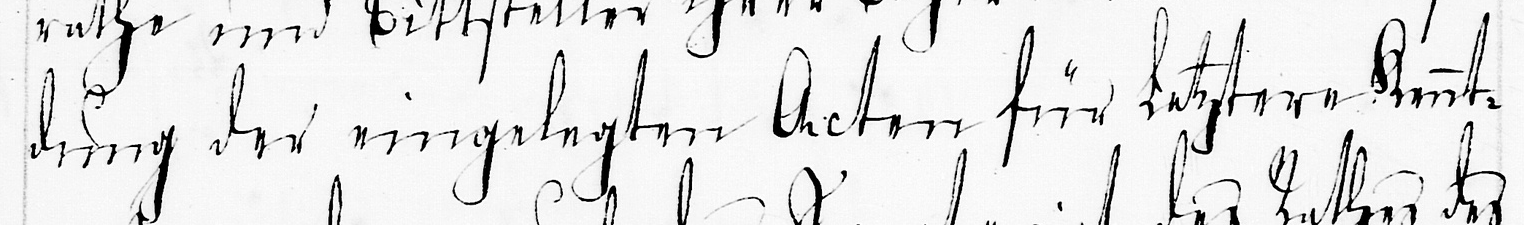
dung der eingelegten Acten für Letztere Kenn¬
